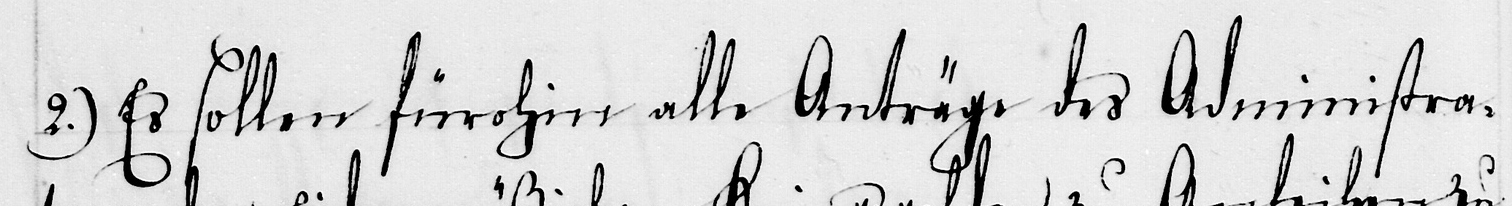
2.) Es sollen fürohin alle Anträge des Administra¬
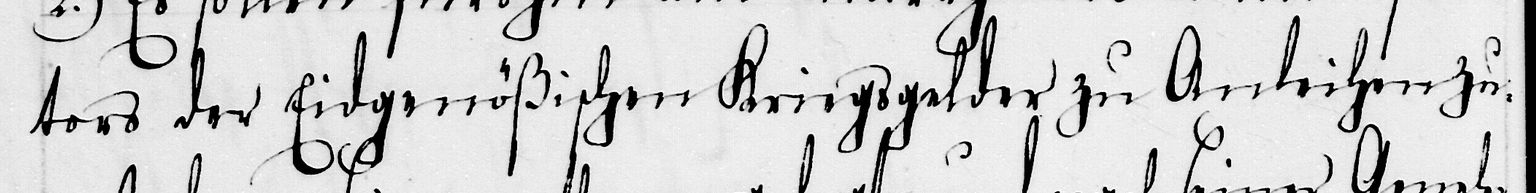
tors der Eidgenößischen Kriegsgelder zu Anleihen zu¬
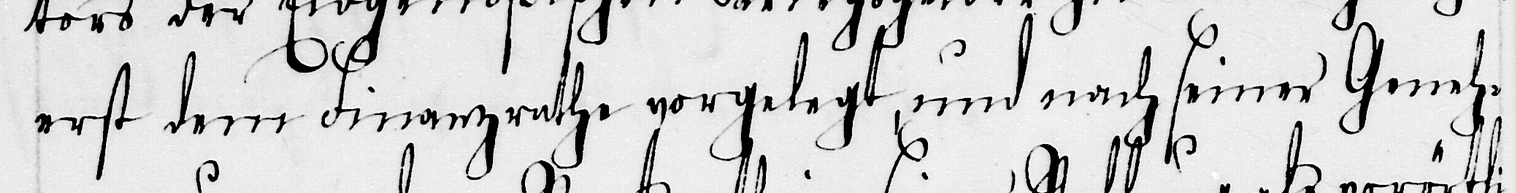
erst dem Finanzrathe vorgelegt, und nach seiner Geneh¬
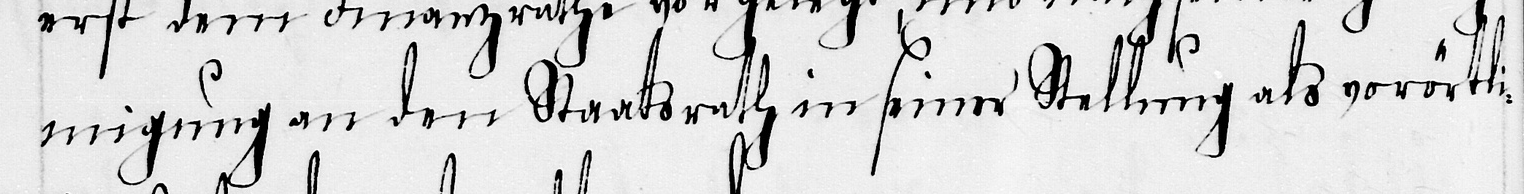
migung an den Staatsrath in seiner Stellung als vorörtl¬
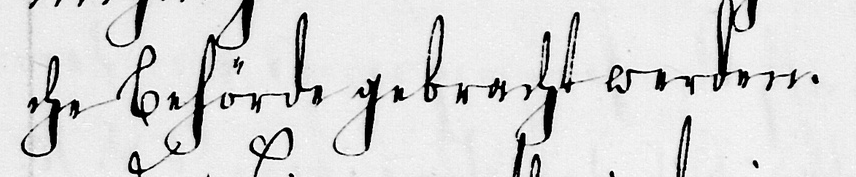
iche Behörde gebracht werden.
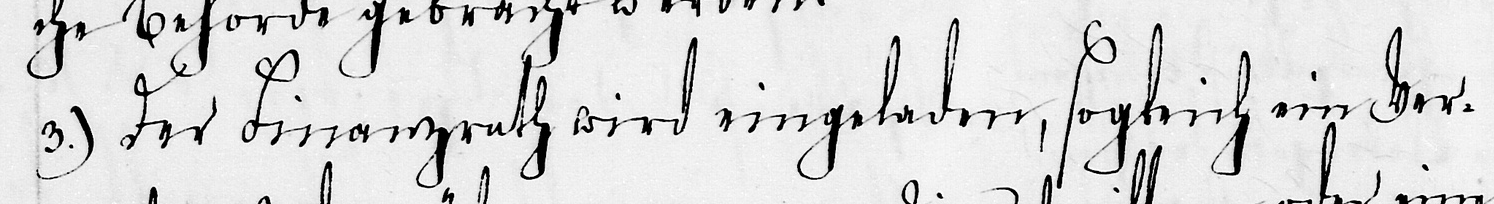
3.) Der Finanzrath wird eingeladen, sogleich ein Ver¬
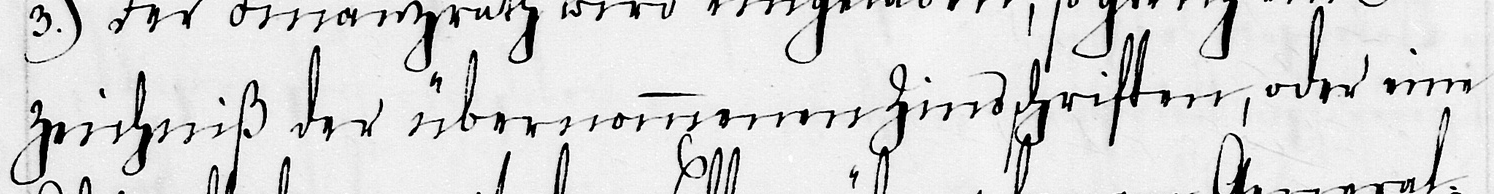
zeichniß der übernommenen Zinsschriften, oder eine
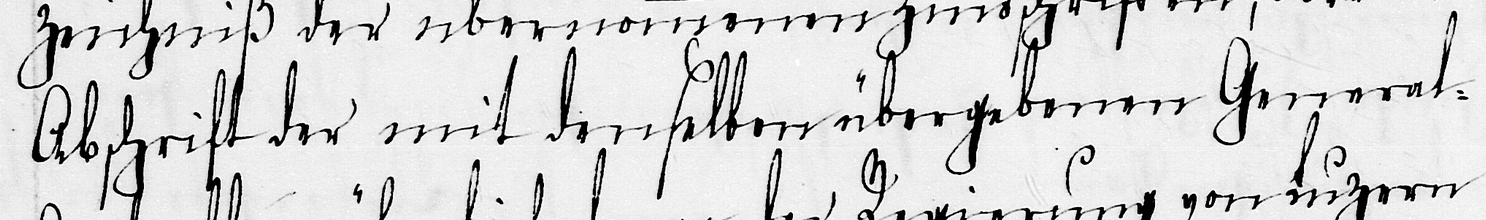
Abschrift der mit denselben übergebenden Genera¬
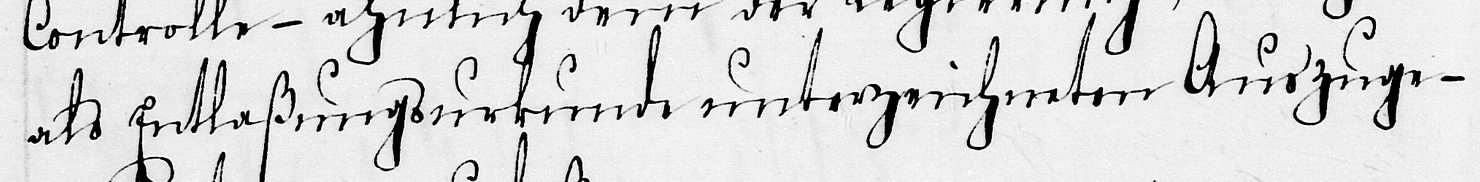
als Entlaßungsurkunde unterzeichneten Auszuge
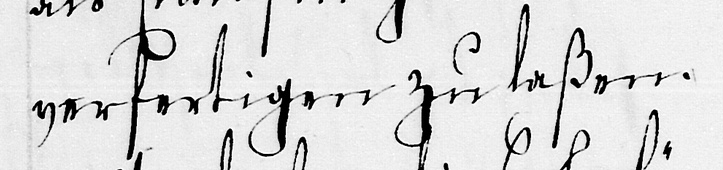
verfertigen zu laßen.
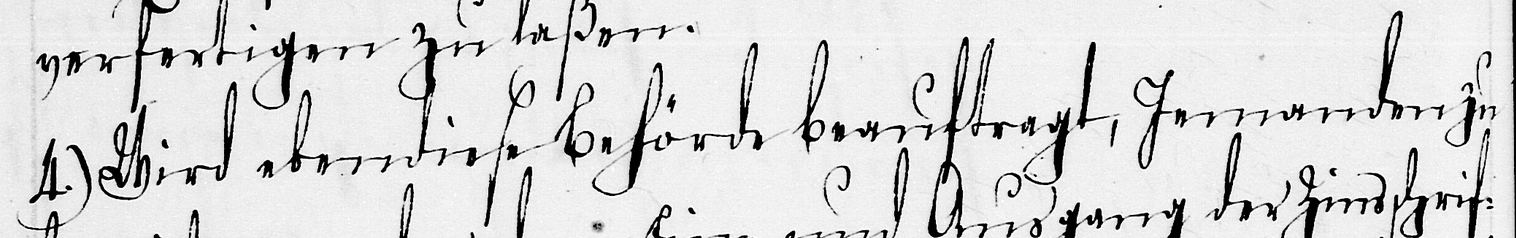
4.) Wird eben diese Behörde beauftragt, Jemanden zu
